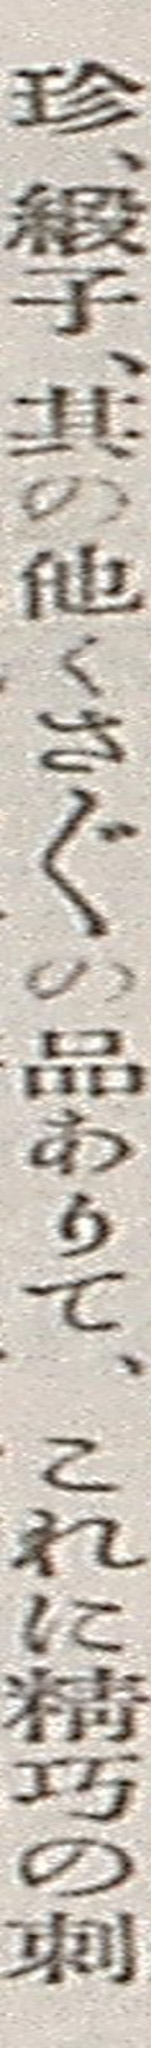珍、緞子、其の他くさ〴〵の品ありて、これに精巧の刺
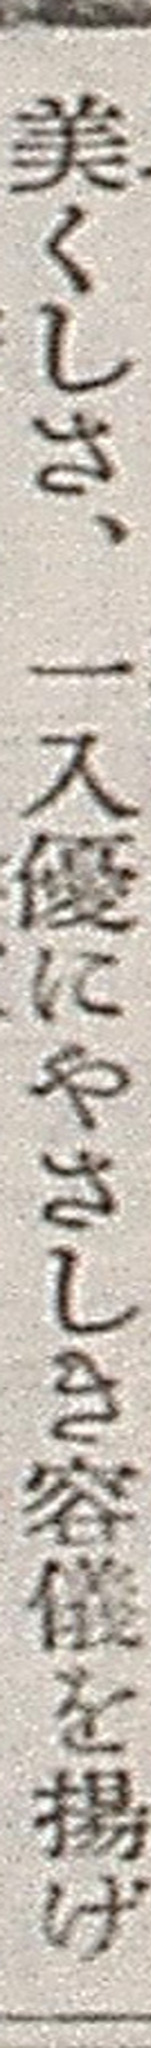美くしさ、一入優にやさしき容儀を揚げ
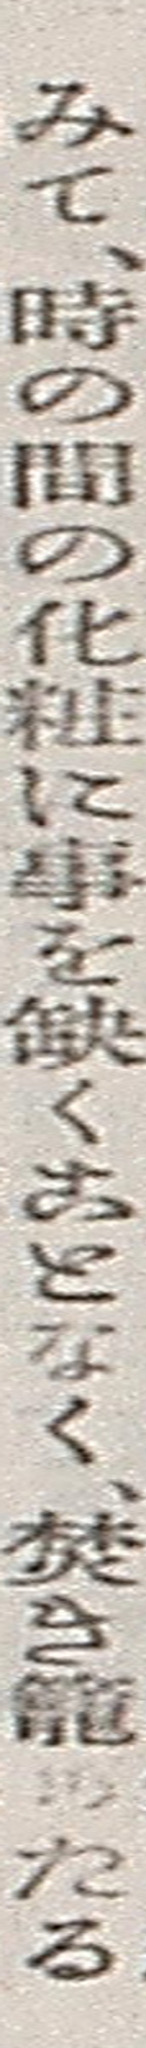みて、時の間の化粧に事を缺くことなく、焚き籠めたる
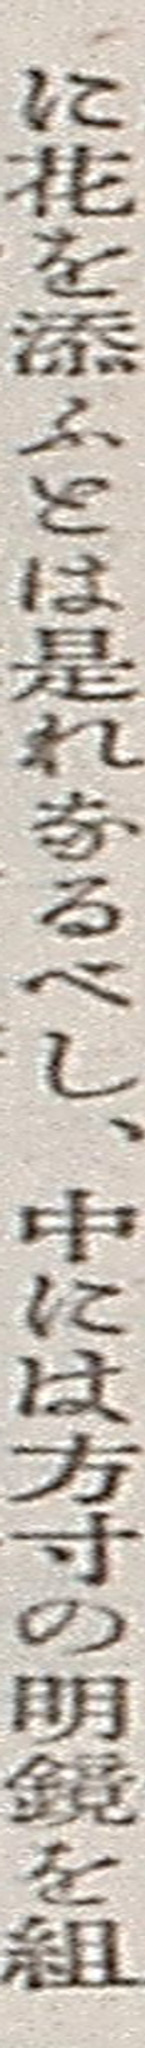に花を添ふとは是れなるべし、中には方寸の明鏡を組
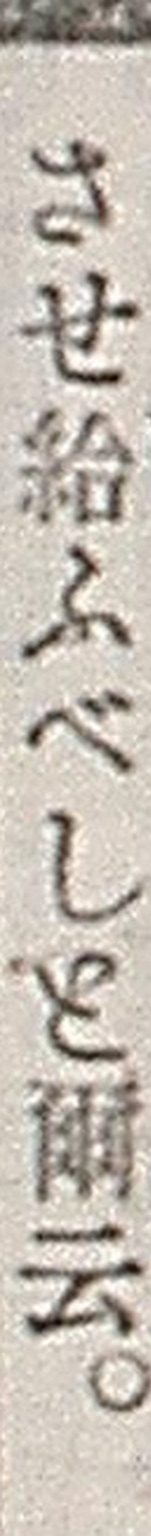させ給ふべしと爾云。
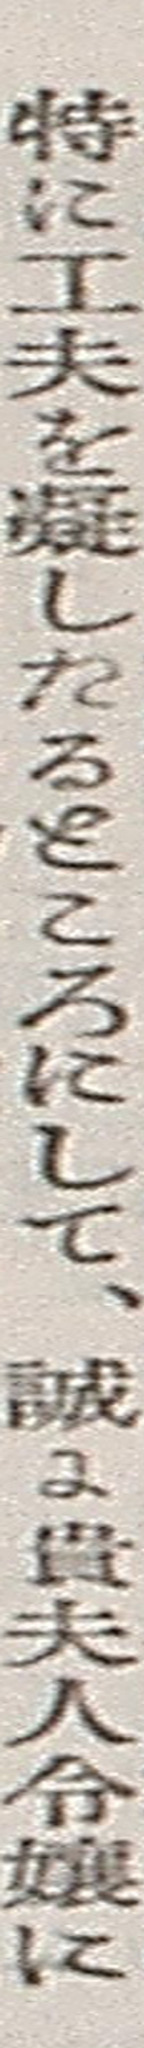特に工夫を凝したるところにして、誠に貴婦人令嬢に
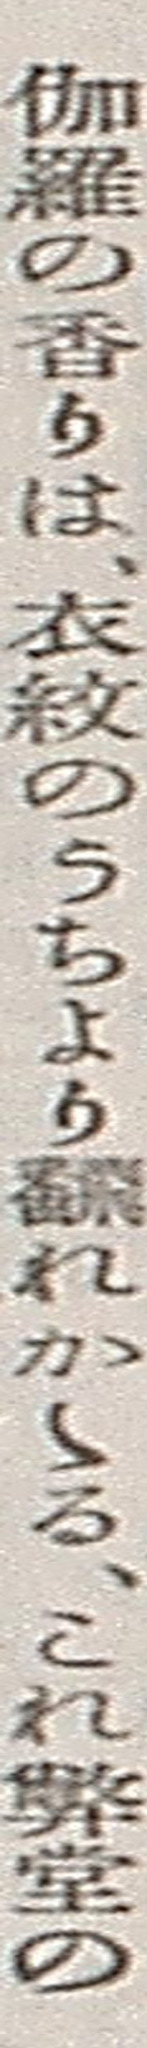加羅の香りは、衣紋のうちより翻れかゝる、これ弊堂の
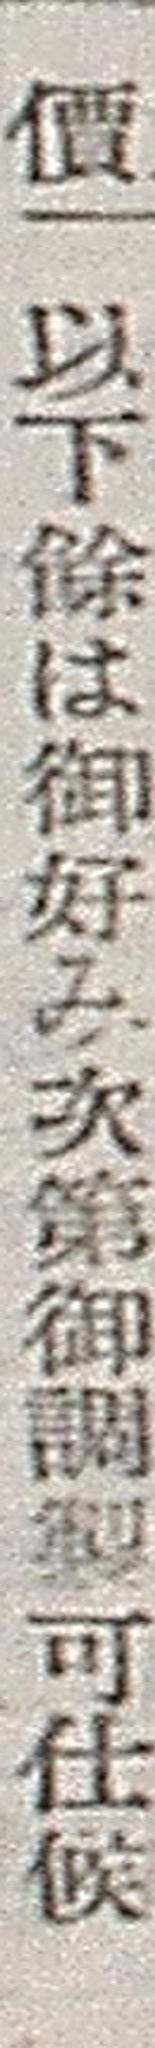価以下餘は御好み次第御調製可仕候
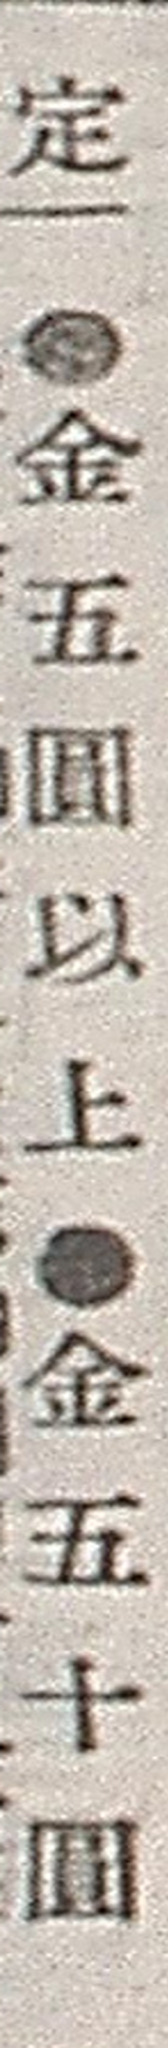定●金五円以上●金五十円
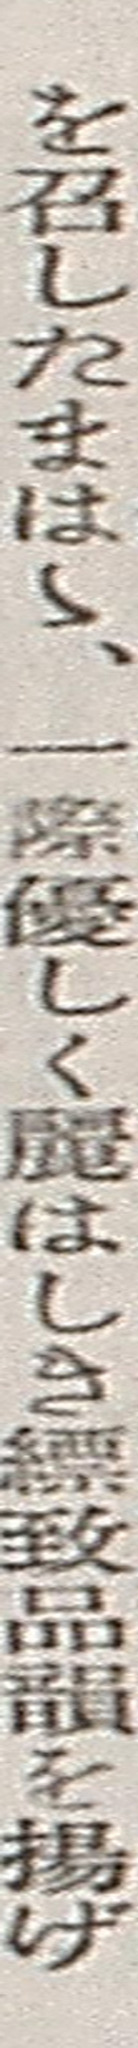を召したまはゝ、一際優しく麗はしき縹致品韻を揚げ
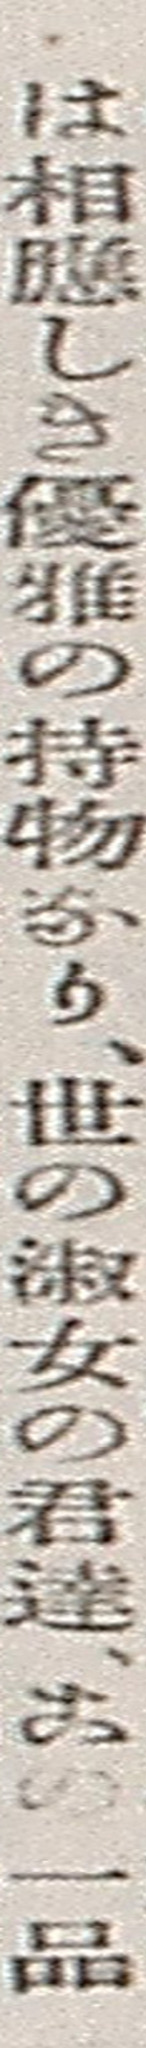は応しき優雅の持物なり、世の淑女の君達、この一品
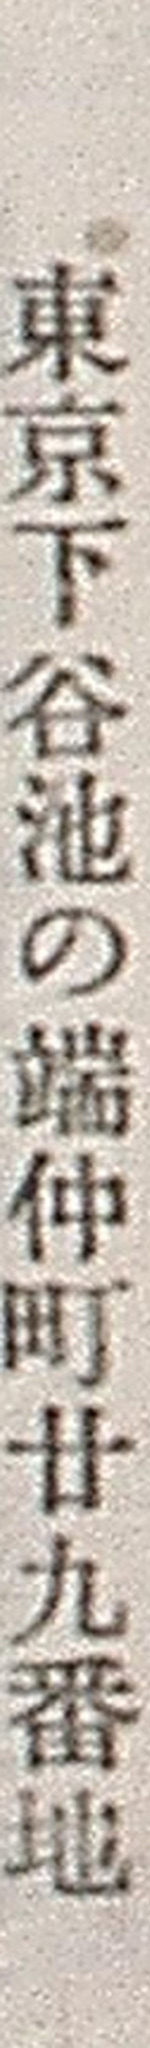東京下谷池の端仲町廿九番地
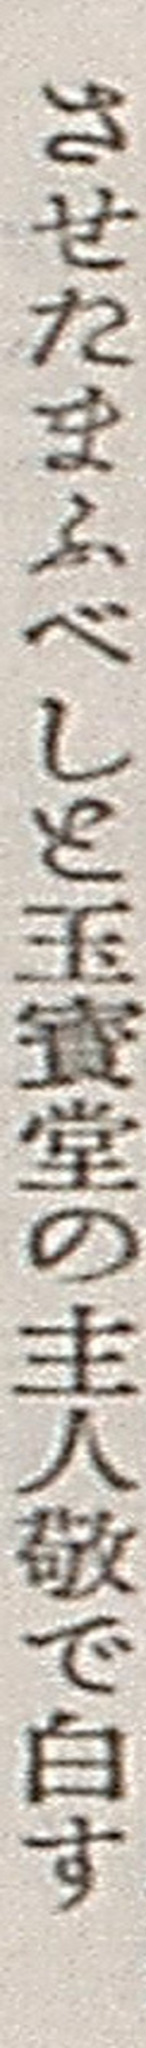させたまふべしと玉寶堂の主人敬で白す
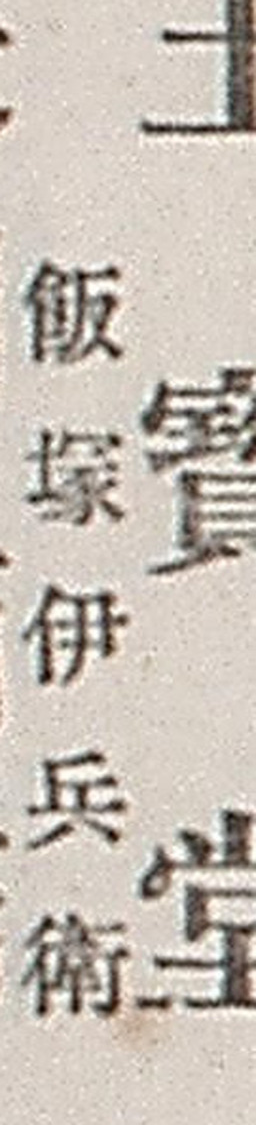飯塚伊兵衛
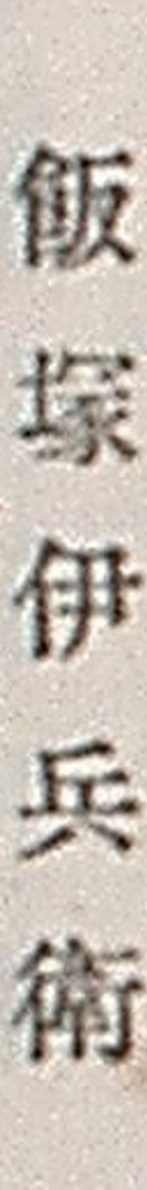飯塚伊兵衛
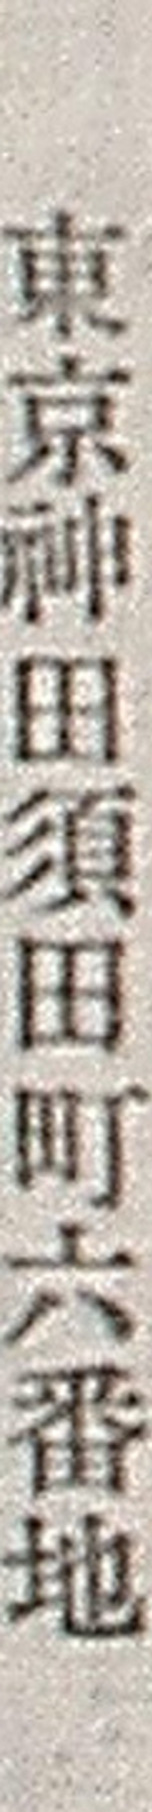東京神田須田町六番地
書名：風俗畫報臨時増刊第百二十六號　洪水被害録（中）
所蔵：東京大学地震研究所図書室 Earthquake Research Institute Library, The University of Tokyo, JAPAN
